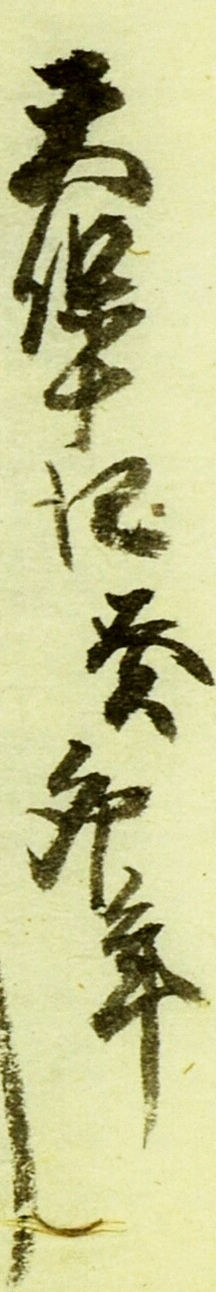天保十四癸卯年
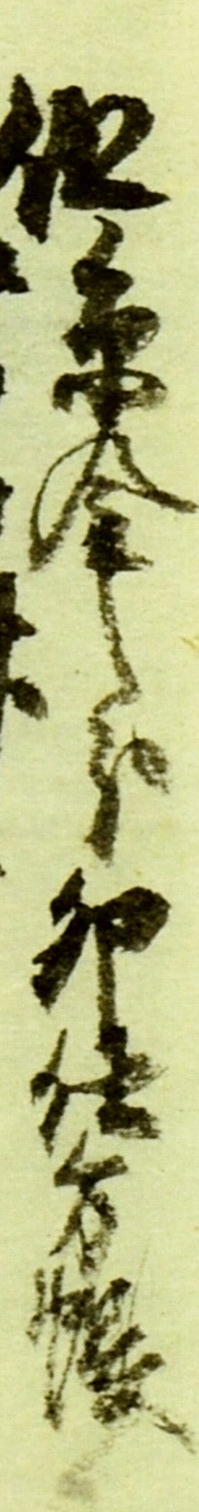但糸金之分卯仕方帳
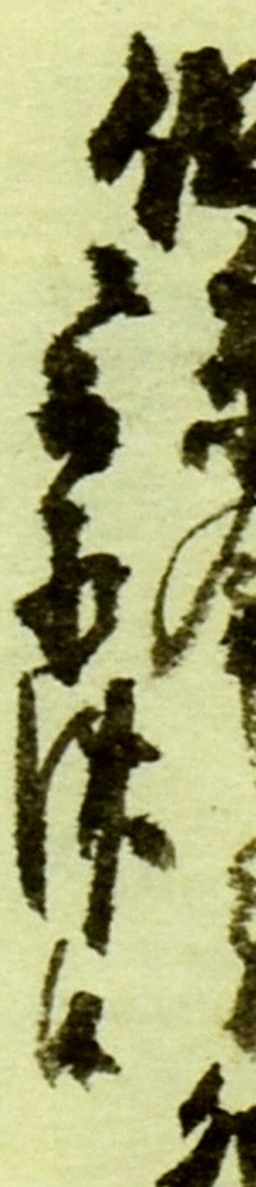ニ而相済候
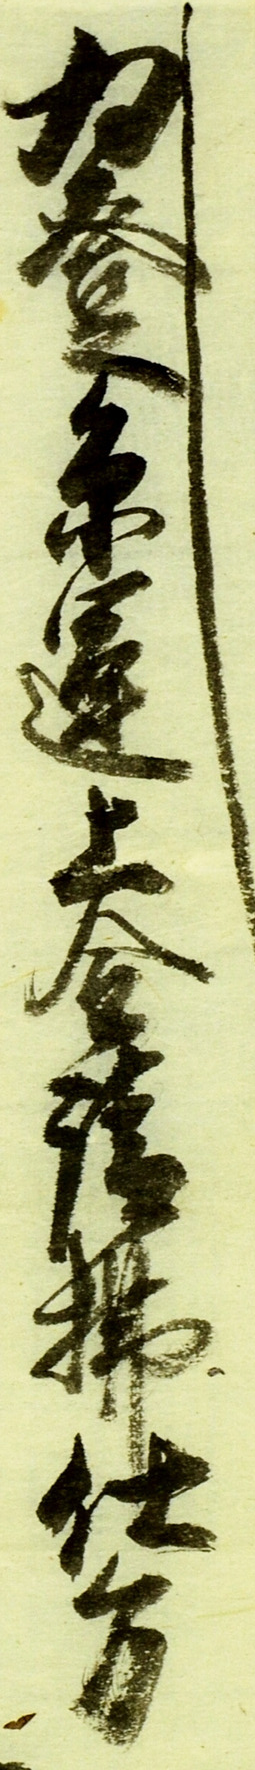為登糸運上金請払仕方
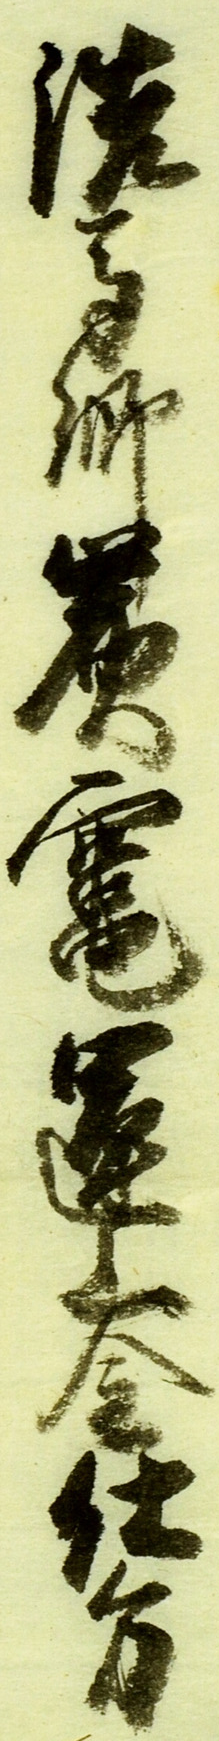洗馬郷炭竃運上金仕方控
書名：為登糸運上金請払仕方、洗馬郷炭竃運上金仕方控
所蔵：伊那市立高遠町図書館・合同会社AMANE
